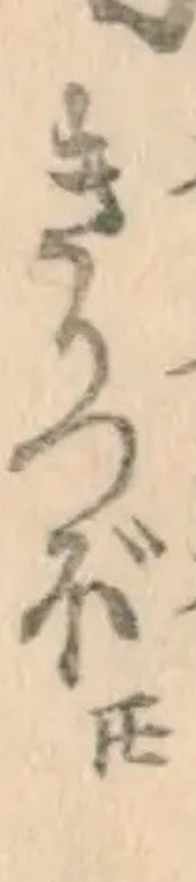きりつぼ共
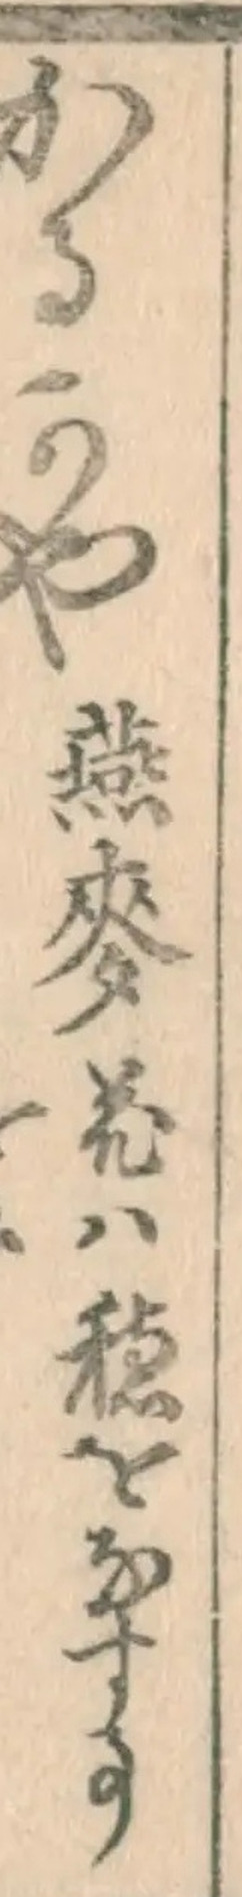かるかや燕麥花ハ穂をはすなり
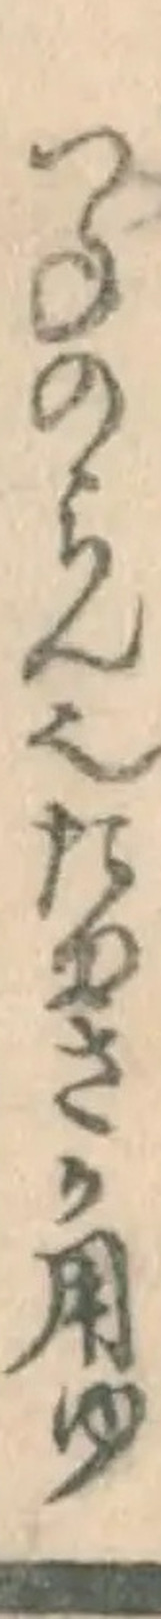つねのらん也たまさか用ゆ
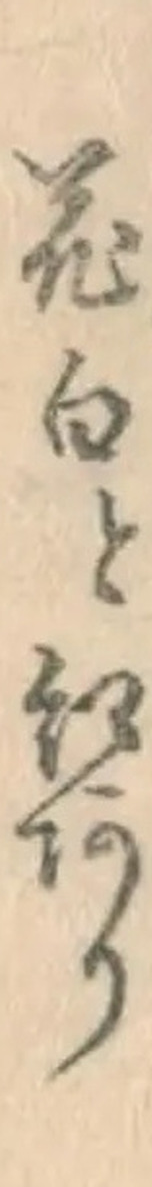花白と紅あり
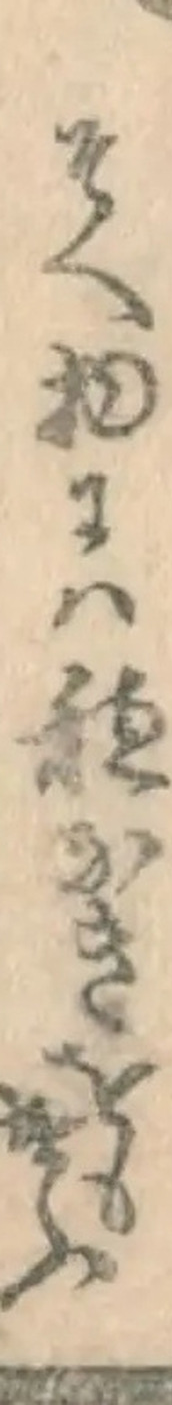そへ物にハ穂なきをも
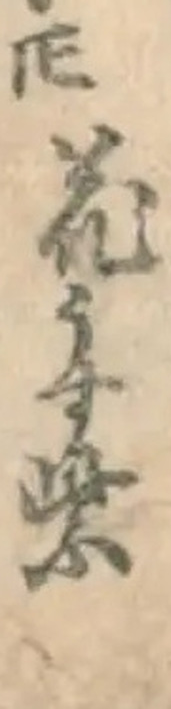花うす紫

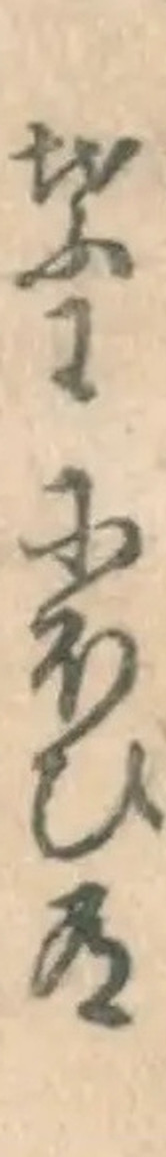葉ににほひ有
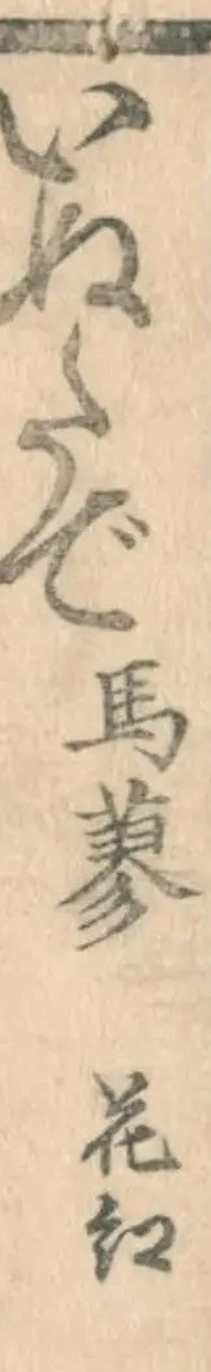いぬたで馬蓼花紅
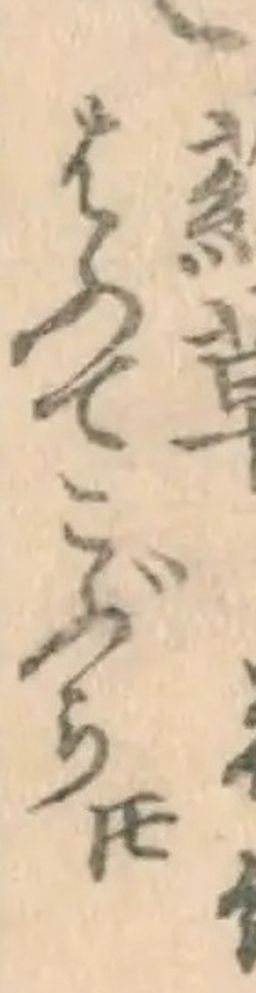はふてこぶら共
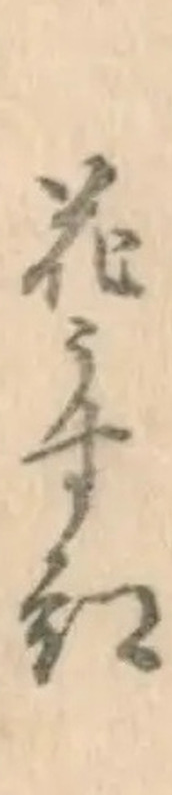花うす紅
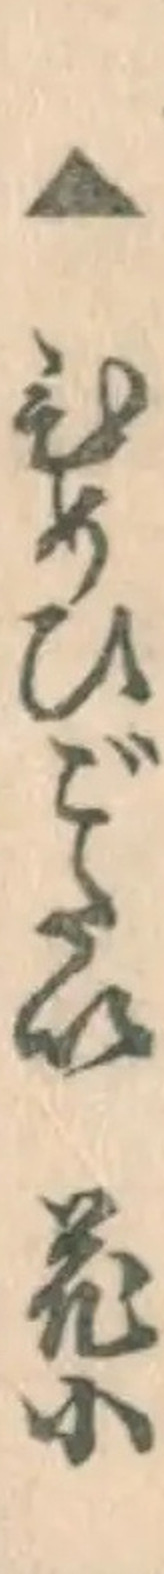▲むめひごたい花小
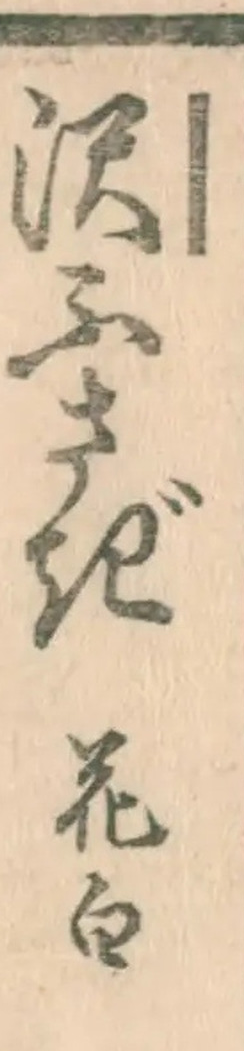沢ふさぎ花白
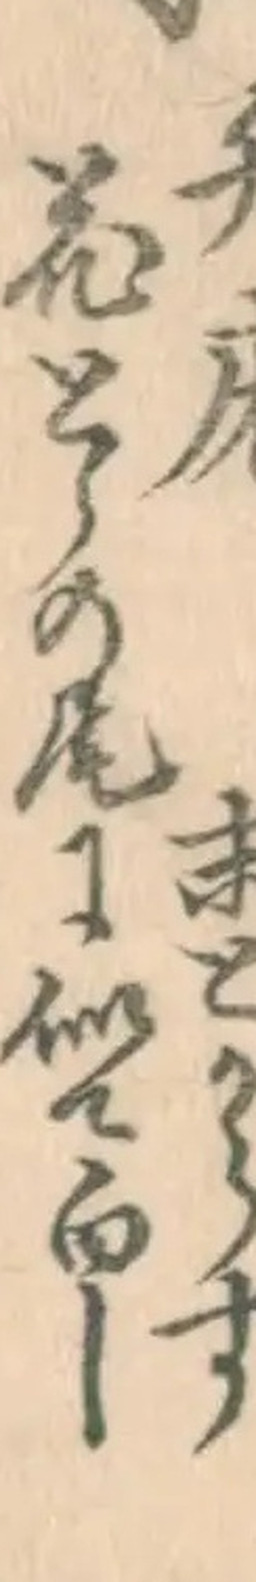花とらの尾に似て白し
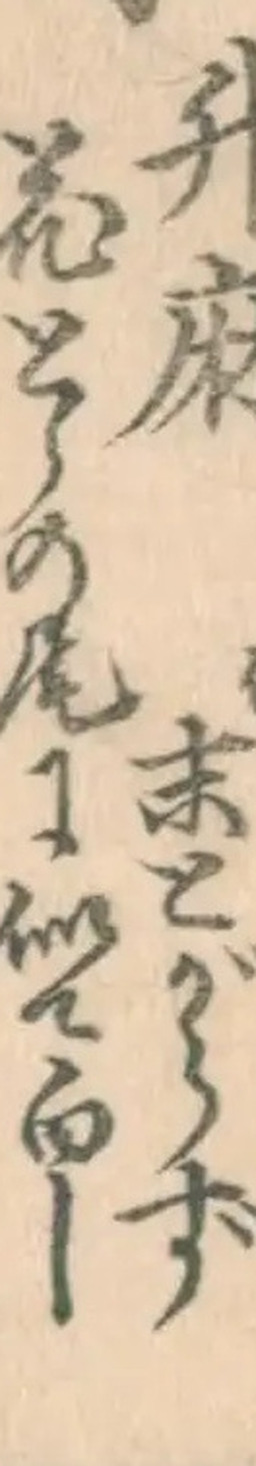花とらの尾に似て白し
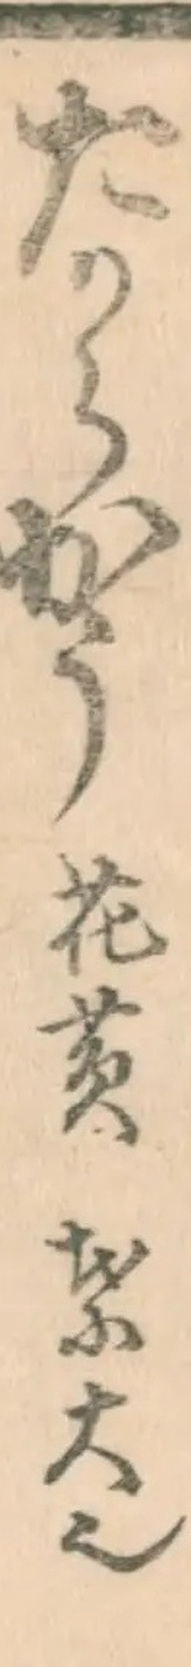たらかう花黄葉大也
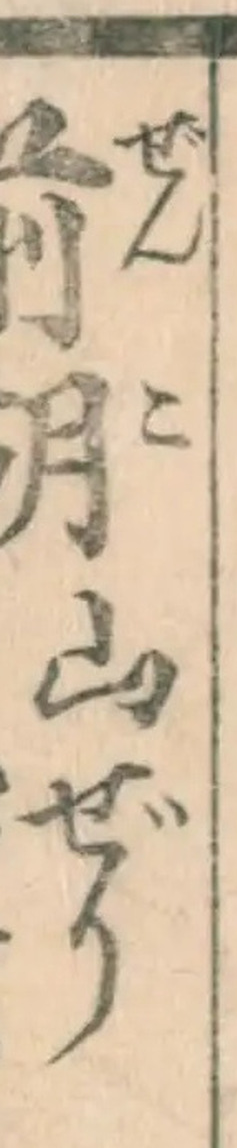前胡山ぜり
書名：茶席挿花集
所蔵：国立国会図書館 National Diet Library, JAPAN
